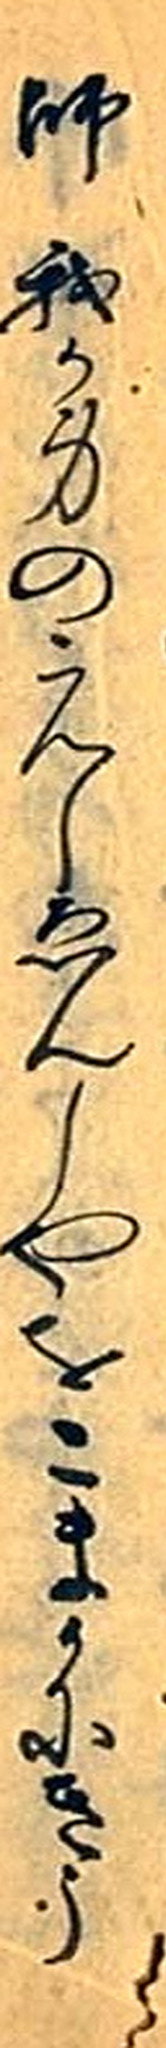師我か身のこんしゑんしやをこまかにきう
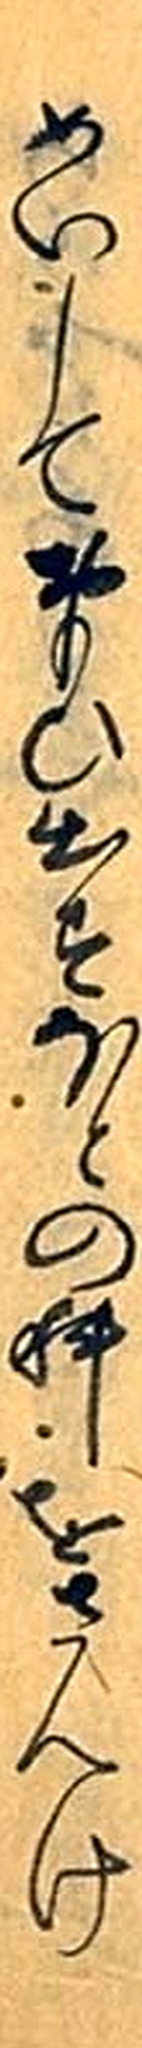めいしておもひ出すほとの科をさんけ
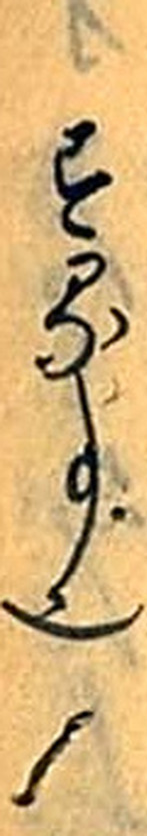する事也

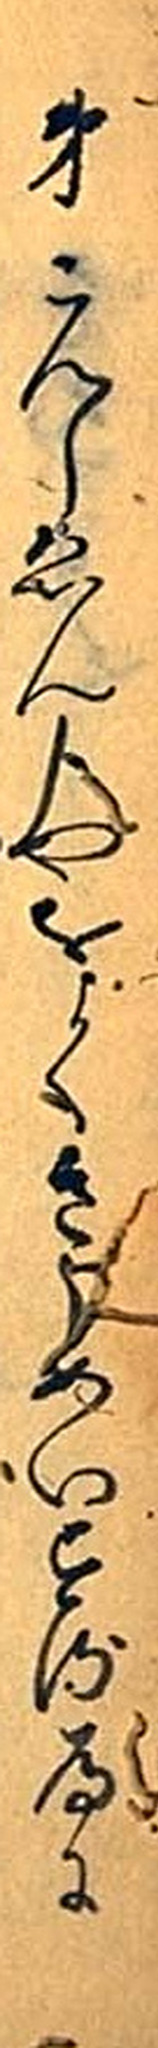弟こんしゑんしやをよくきうめいする為に
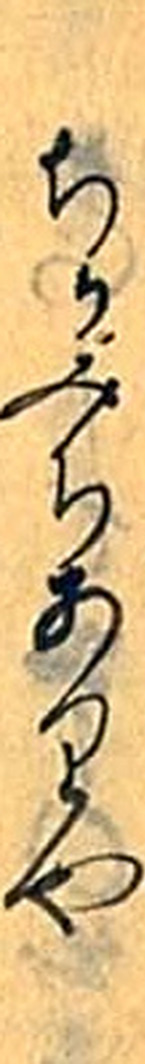ちかみちありや
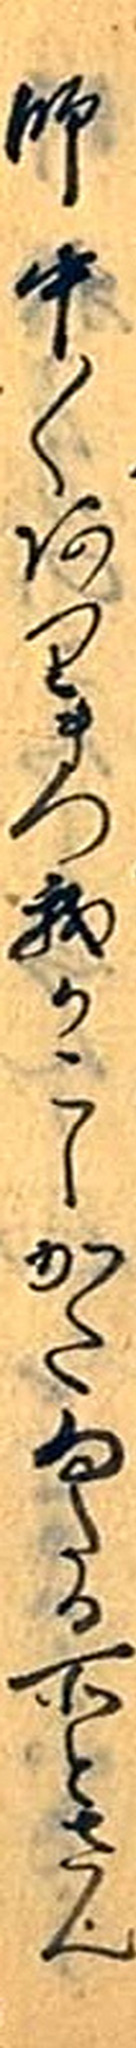師中〳〵ありまつ我かこしかたゐたる所とさん
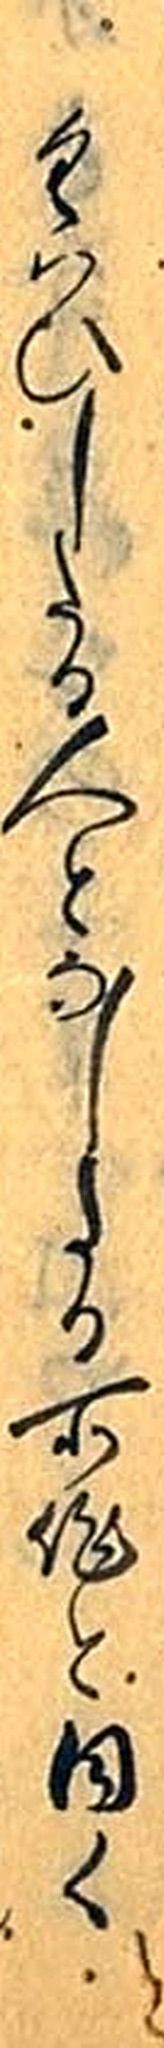くはひしたる人となしたる所作と同く
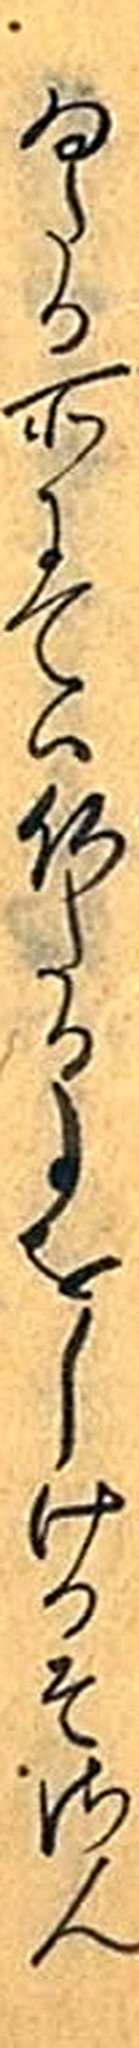ゐたる所にては何たる事をしけるそさん
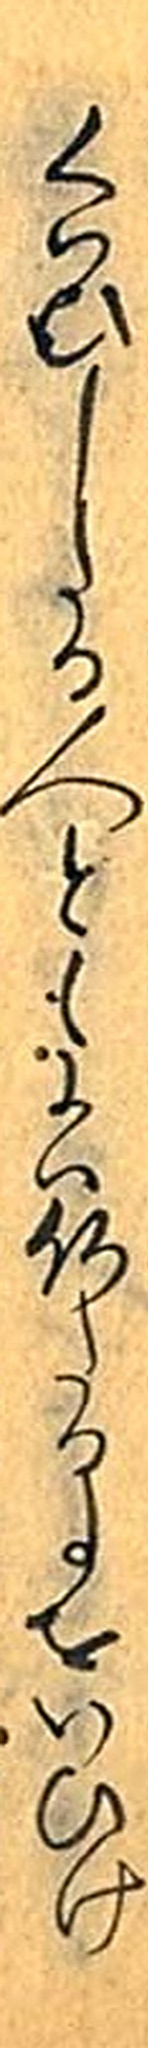くはひしたる人ともには何たる事をいひけ
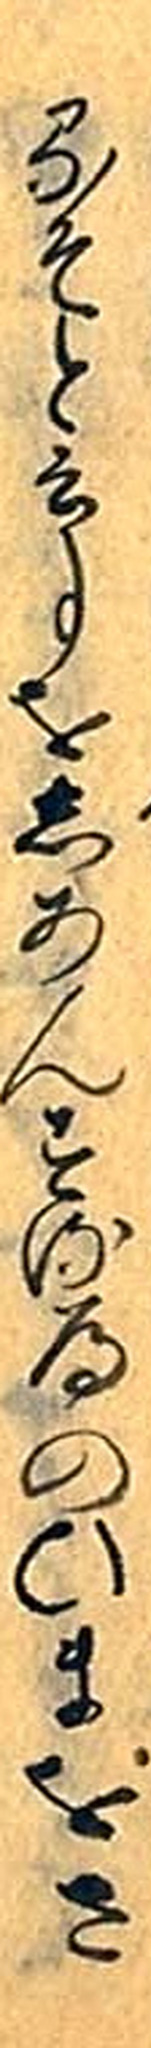るそと云事をしあんする為のひまをさ
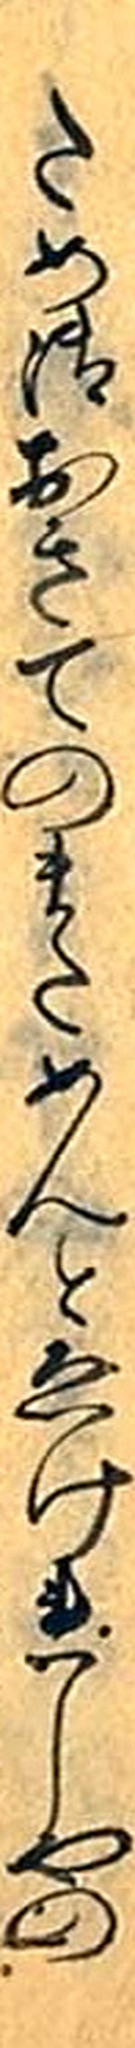ため御おきてのまためんとゑけれしやの
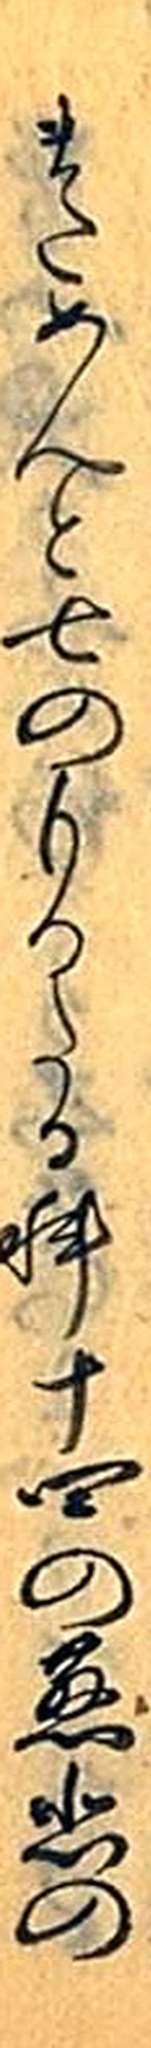まためんと七のもるたる科十四の慈悲の
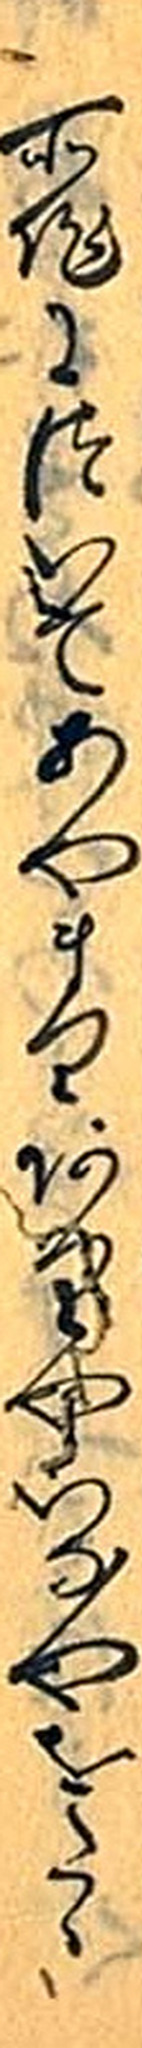所作についてあやまりありやいなやをたゝ
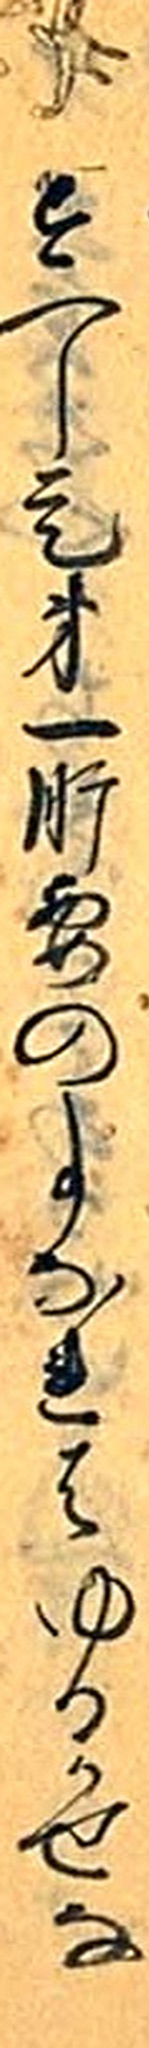すへし是第一肝要の事なれはゆるかせな
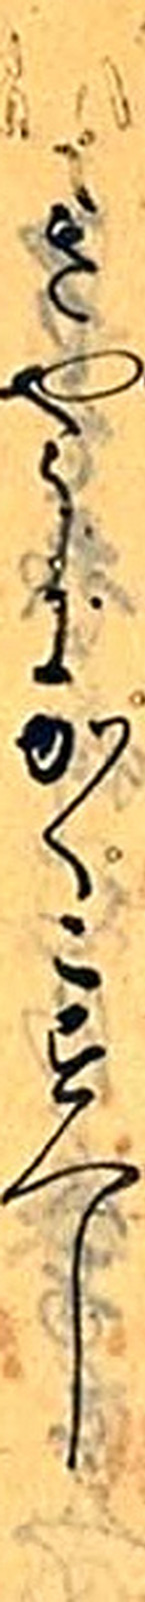きやうにかくこすへし
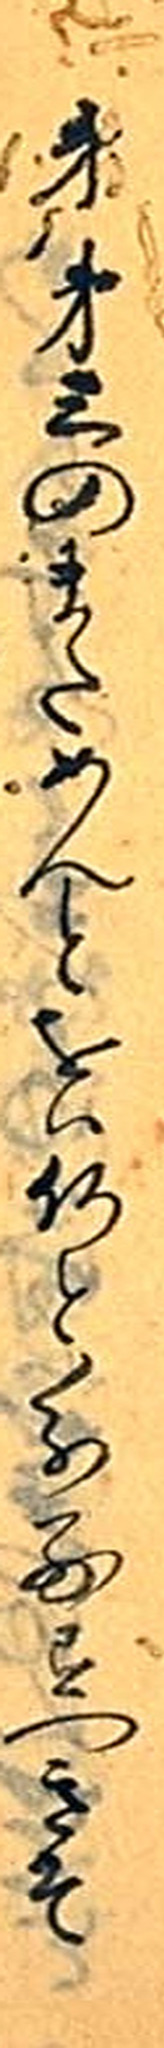弟第三のまためんとをは何と分別すべきそ
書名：ドチリナ・キリシタン
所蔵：東京大学総合図書館 / General Library in the University of Tokyo
